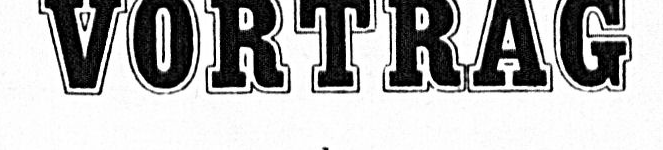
VORTRAG
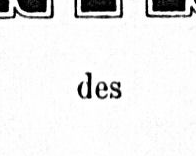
des
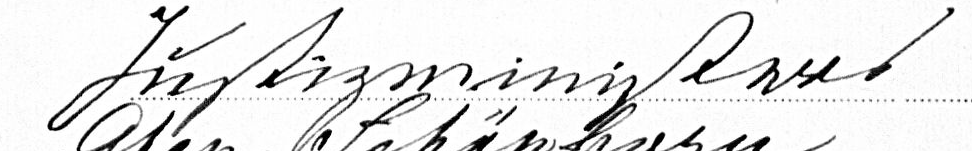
Justizministers
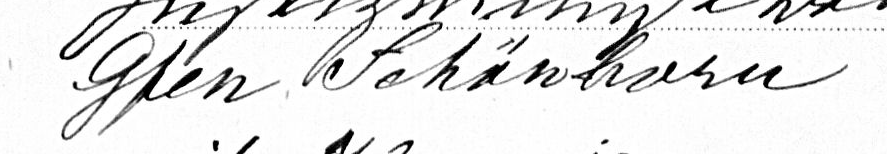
Gfen Schönborn
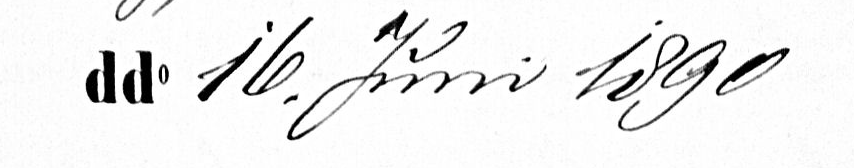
dd° 16. Juni 1890
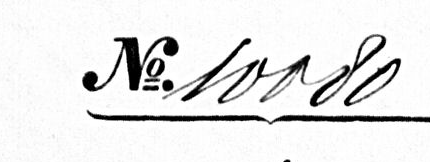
N° 10080
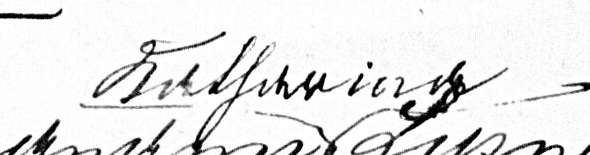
Katharina
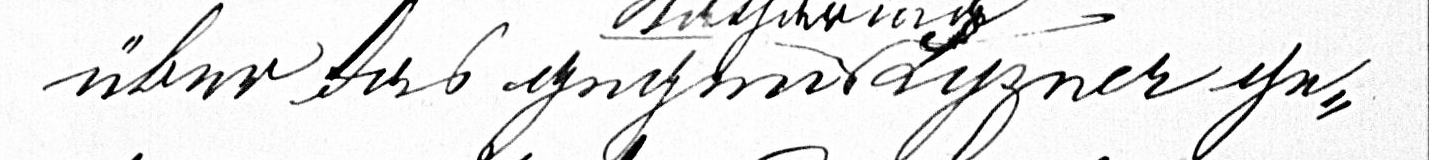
über das gegen Lyzner ge¬
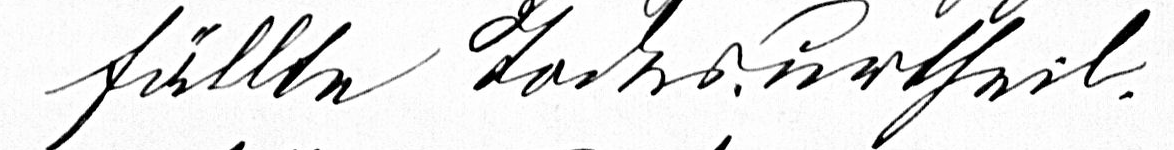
fällte Todesurtheil.
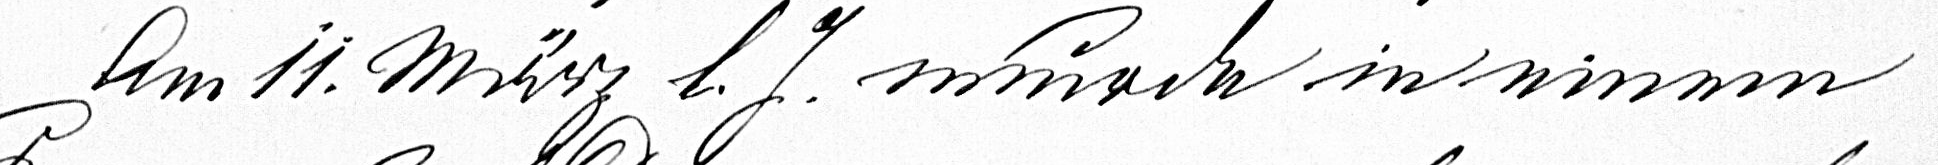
Am 11. März l. J. wurde in einem
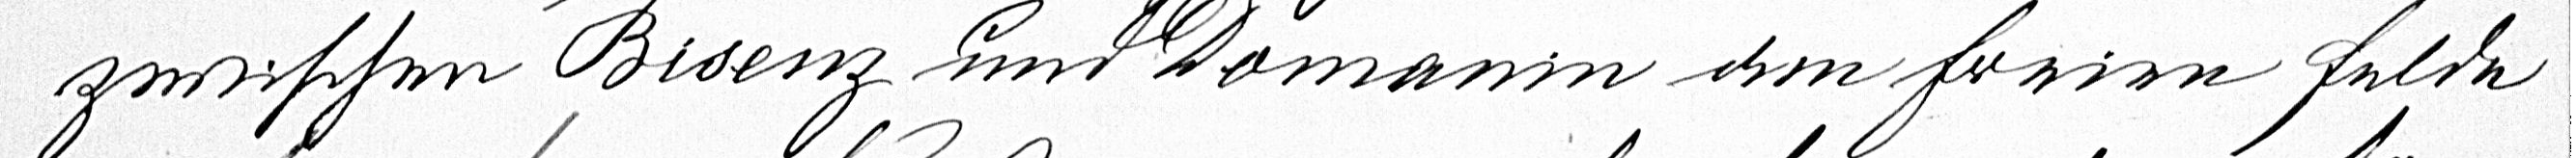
zwischen Bisenz um Domanin den freien felde
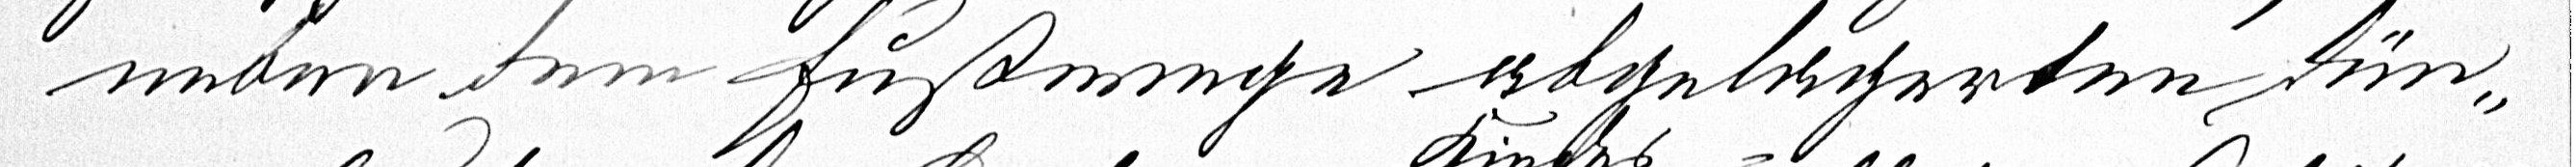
enden dem Fußwege abgelagerten Dün¬
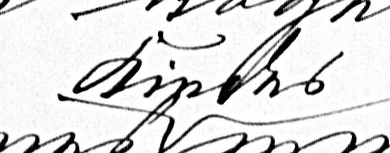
Kindes
